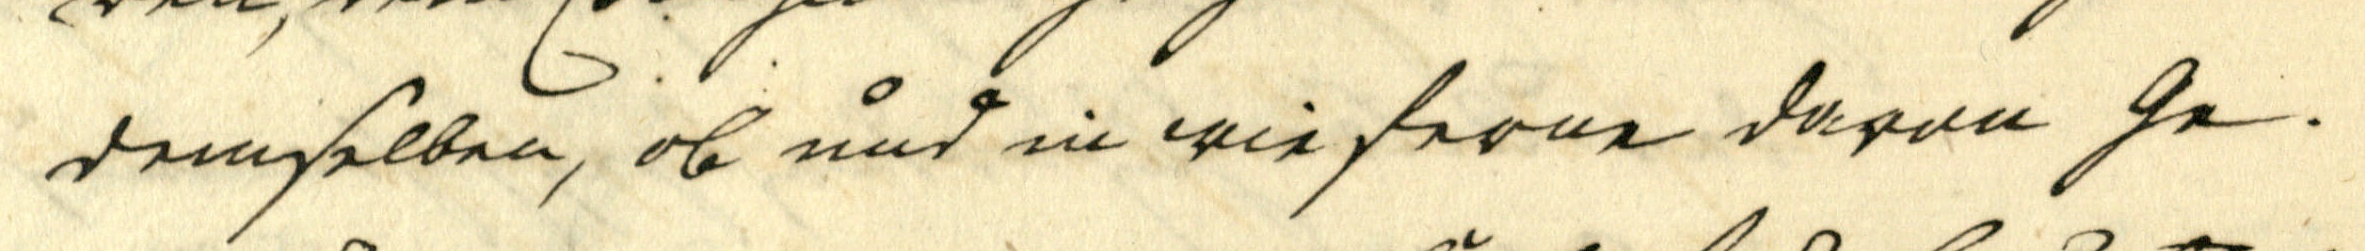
demselben, ob und in wie ferne davon Ge¬
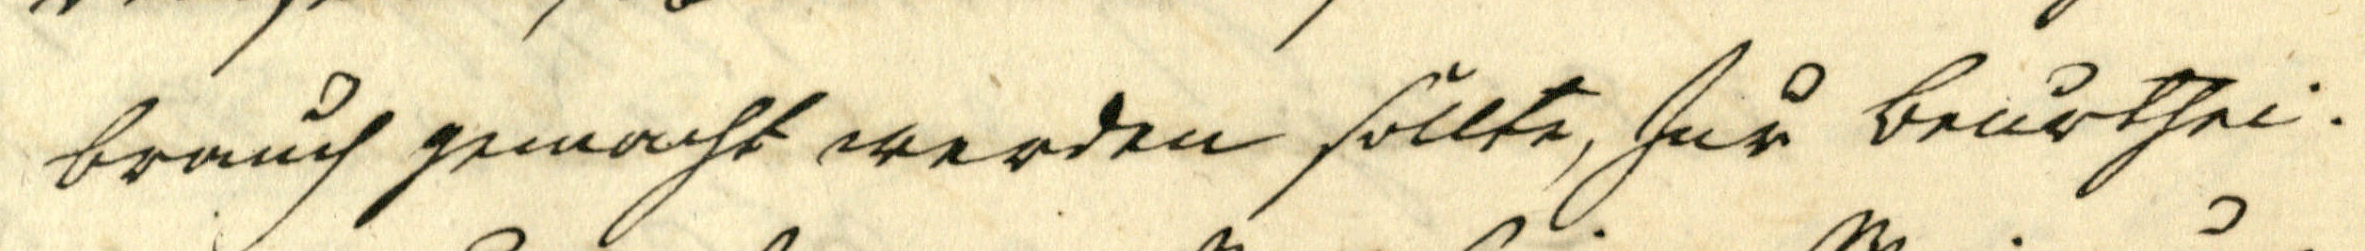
brauch gemacht werden sollte, zur Beurthei¬
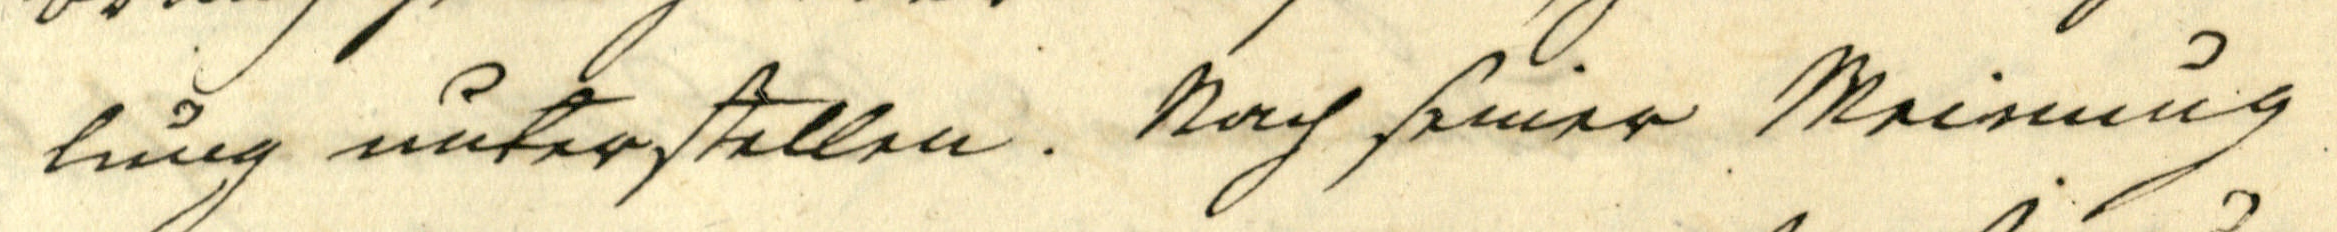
lung unterstellen. Nach seiner Meinung
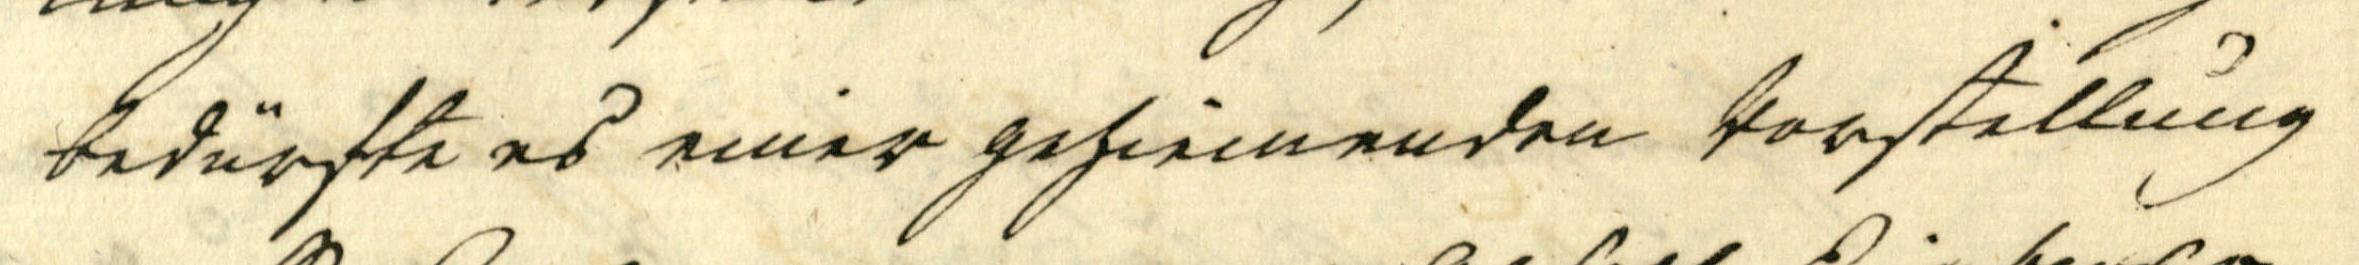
bedürfte es einer geziemenden Vorstellung
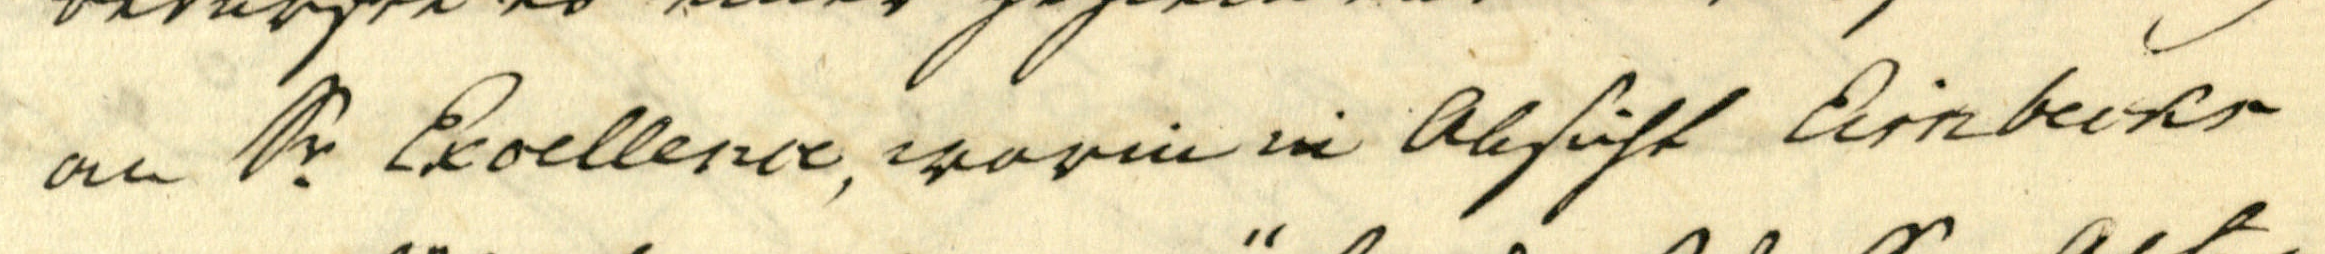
an Sr. Excellence, worin im Absicht Eimbecks
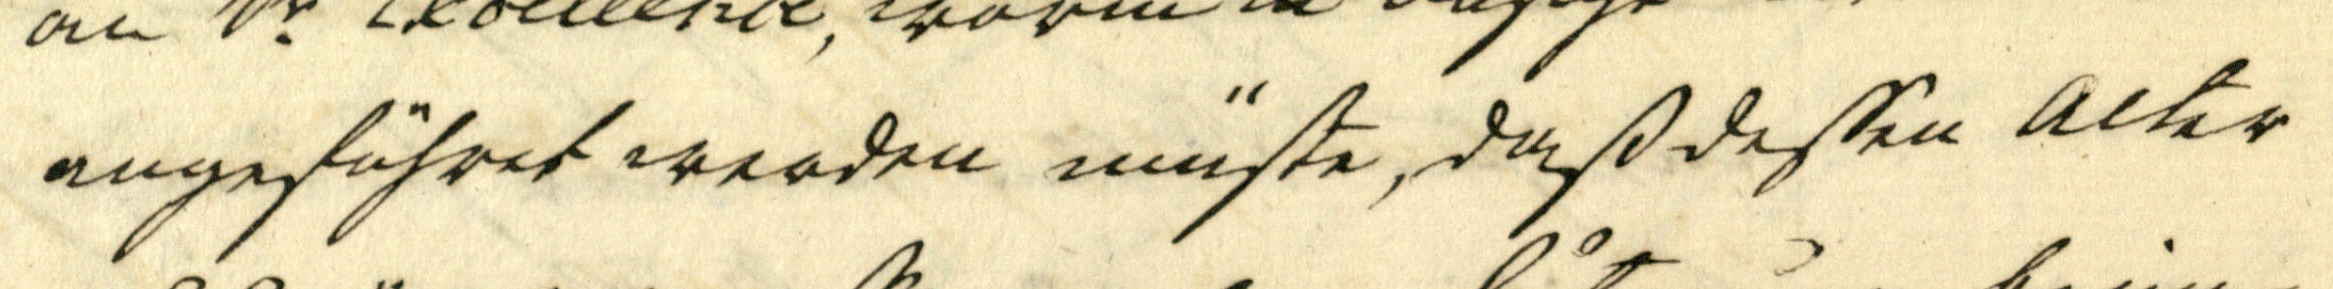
angeführet werden müßte, daß dessen Alter
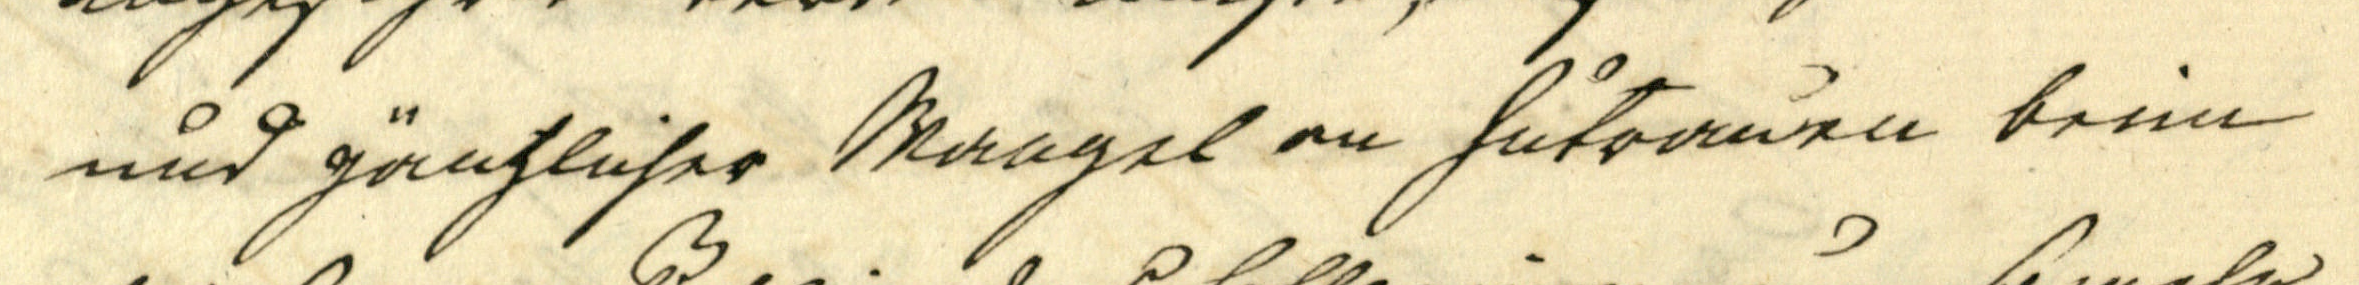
und gäntzlicher Mangel an Zutrauen beim
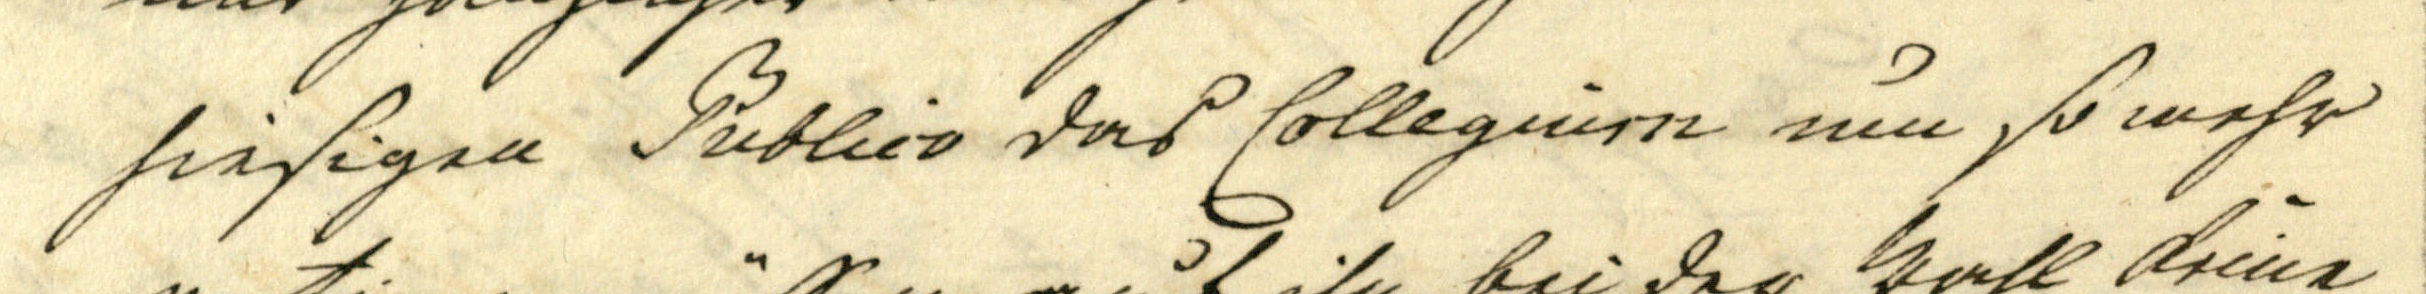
hiesigen Publico das Collegium um so mehr
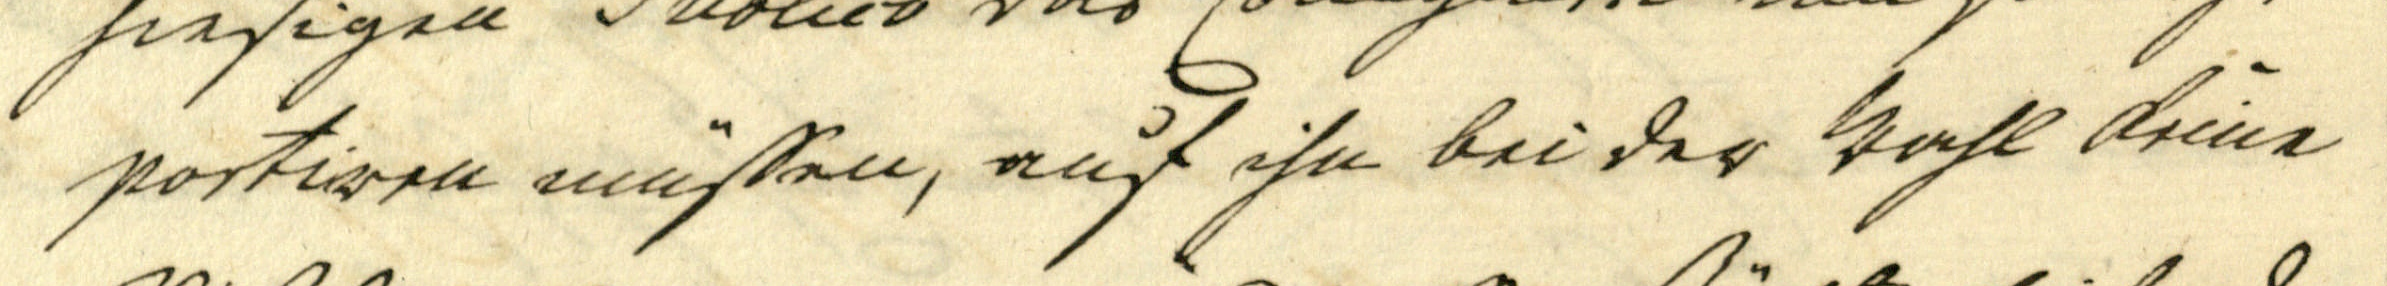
portiren müssen, auf ihn bei der Wahl keine
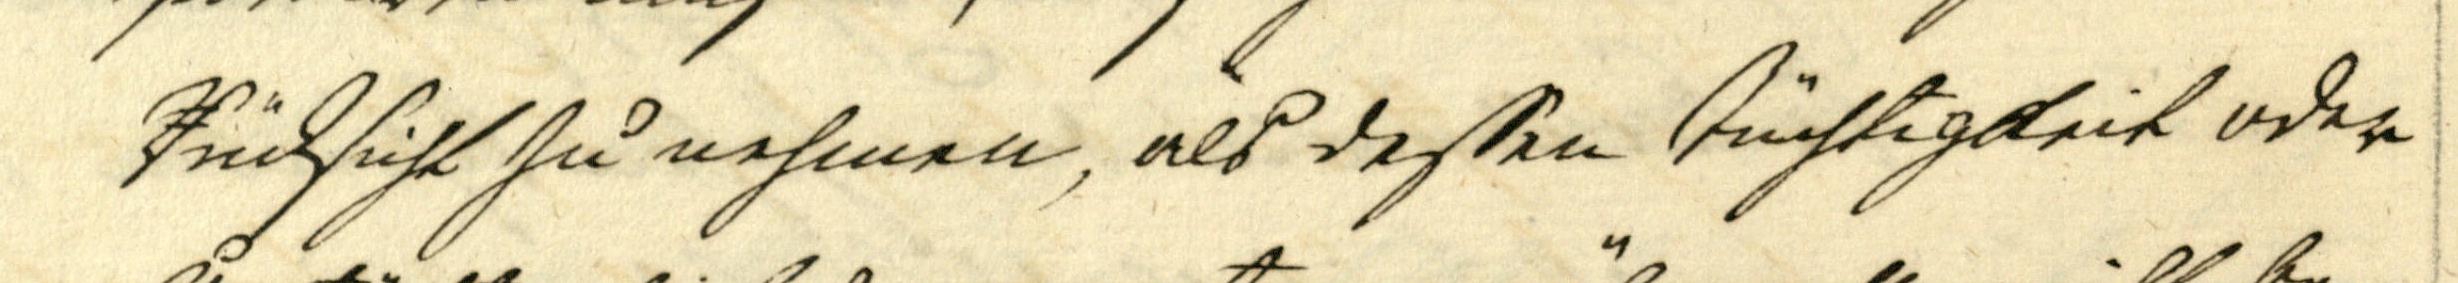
Rücksicht zu nehmen, als dessen Tüchtigkeit oder
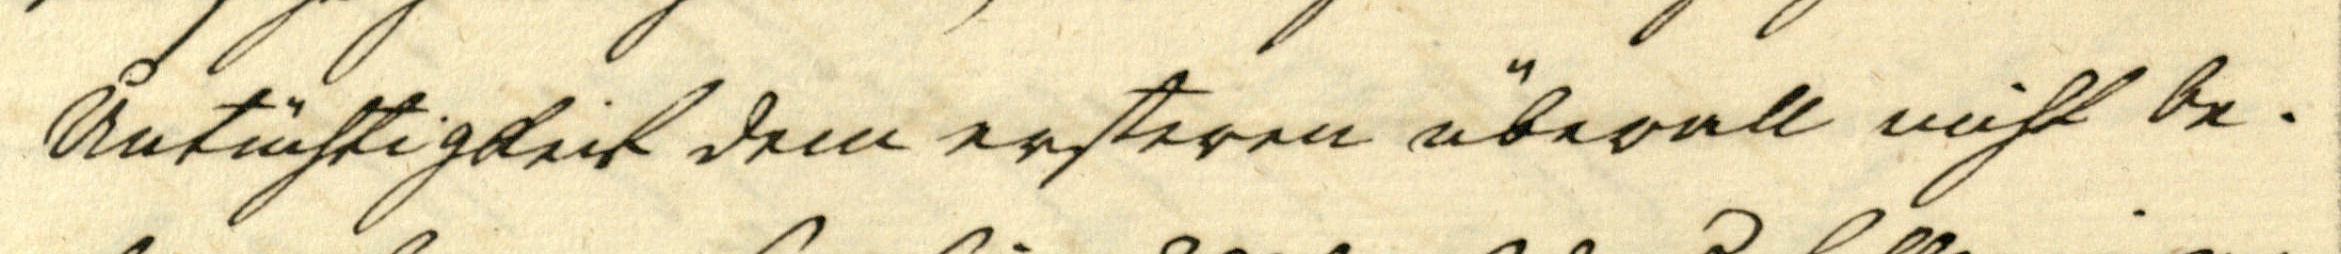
Untüchtigkeit dem ersteren überall nicht be¬
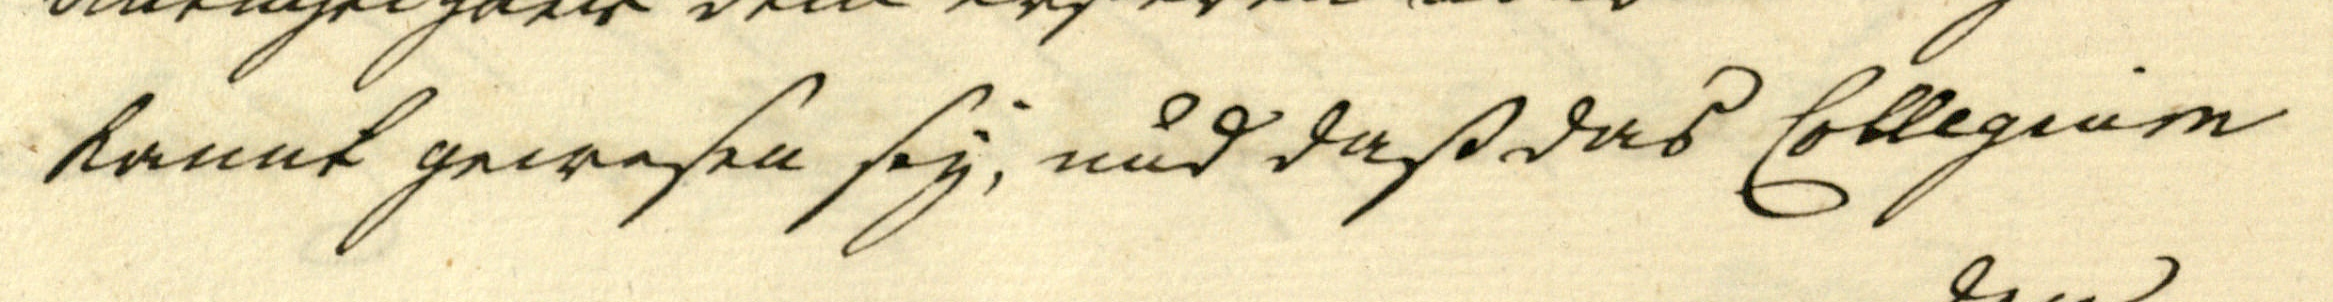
kannt gewesen seÿ, und daß das Collegium
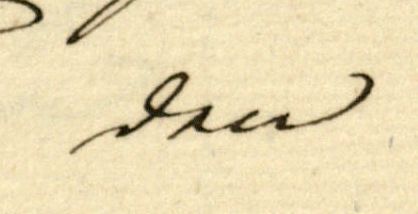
den
